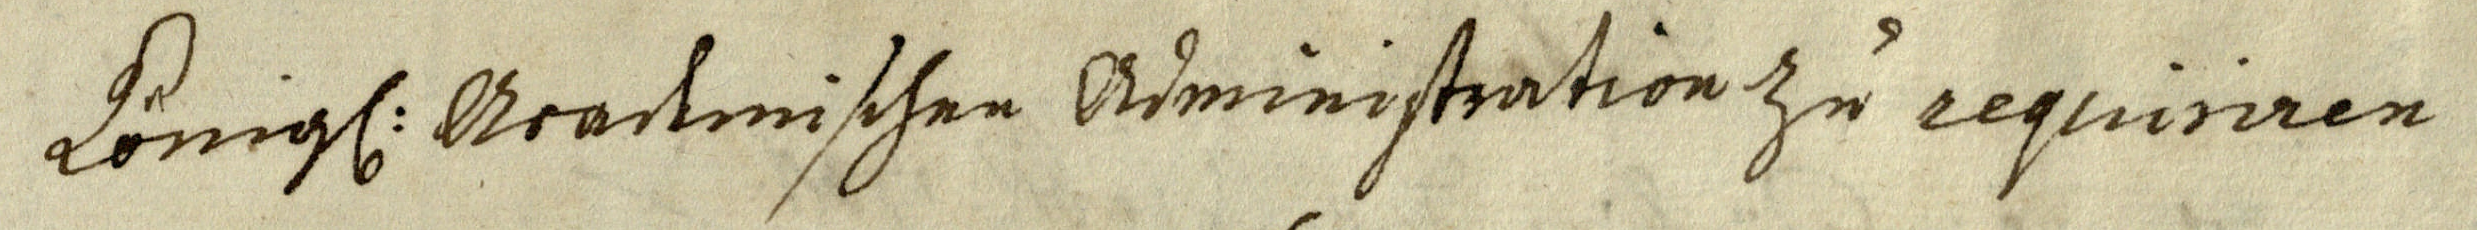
Königl. Academischen Administration zu requiriren.
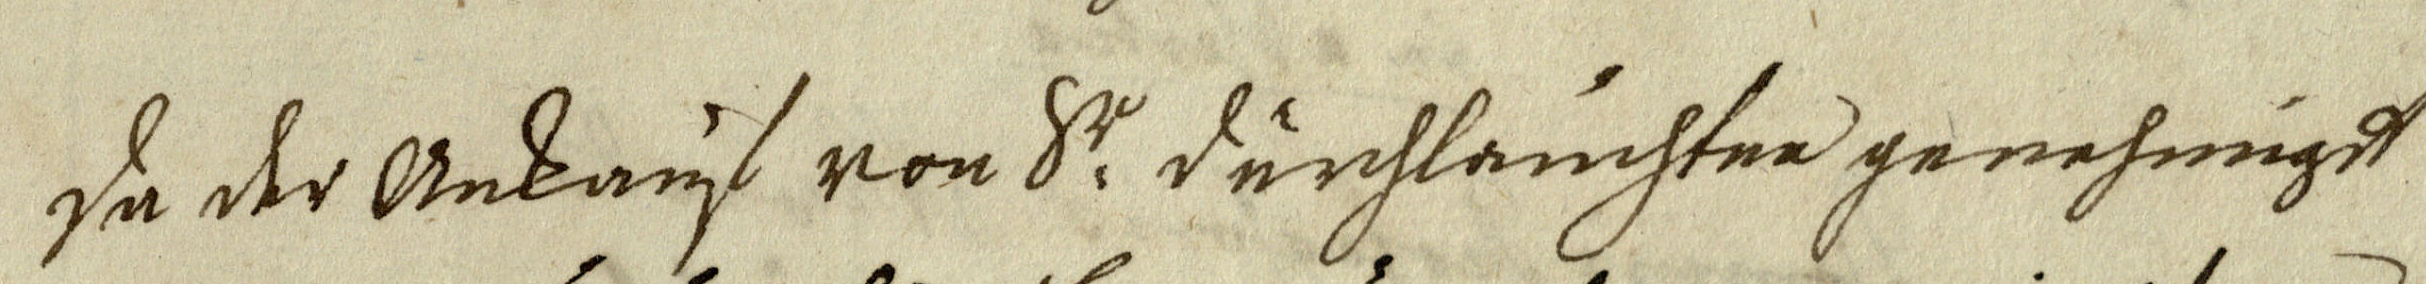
Da der Ankauf von Sr. Durchlauchten genehmiget
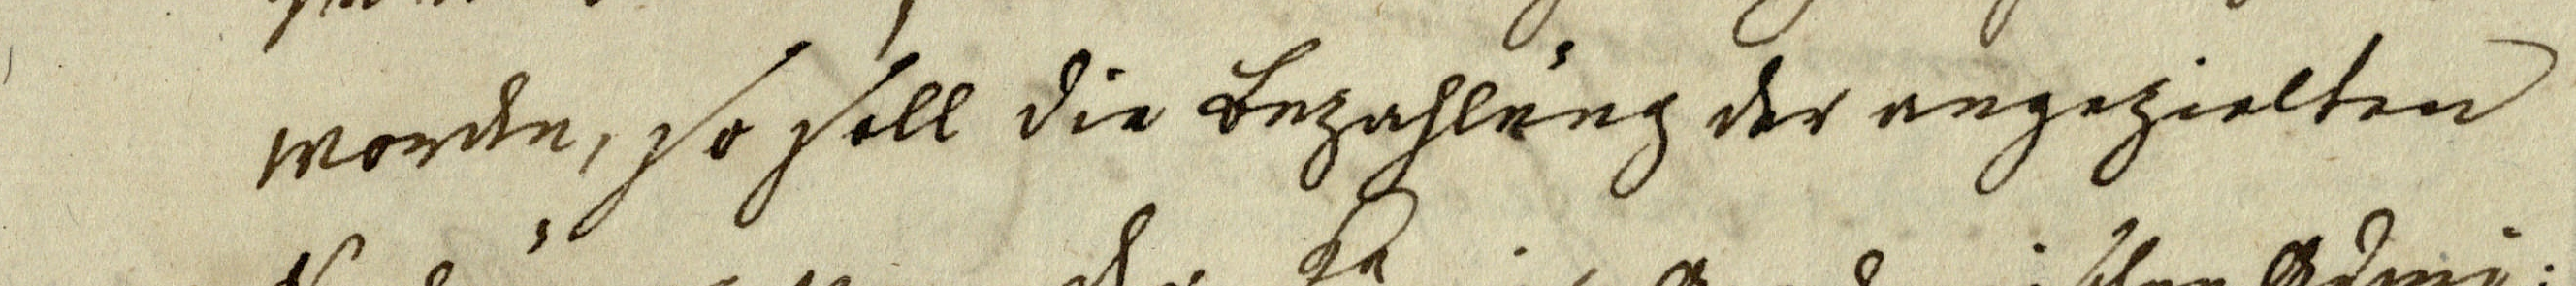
worden, so soll die Bezahlung der angezielten
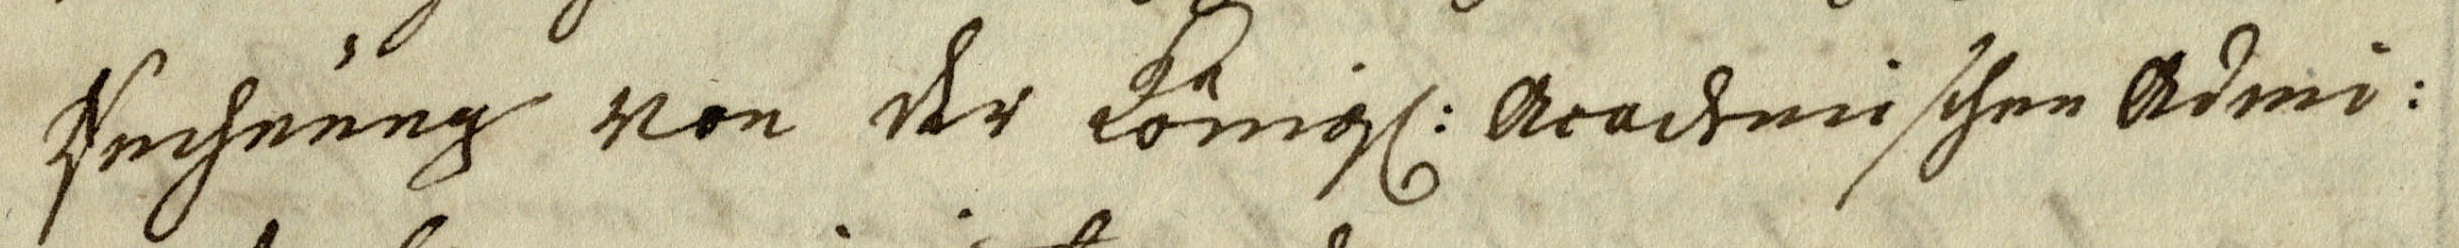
Rechnung von der Königl. Academischen Admi¬
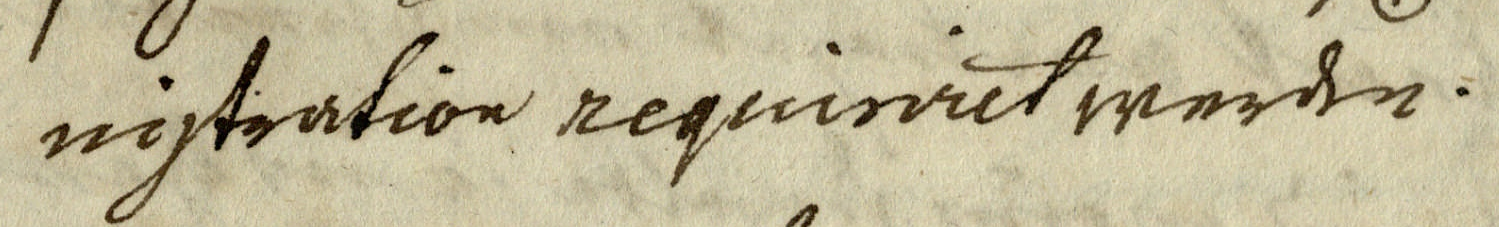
nistration requiriret werden.
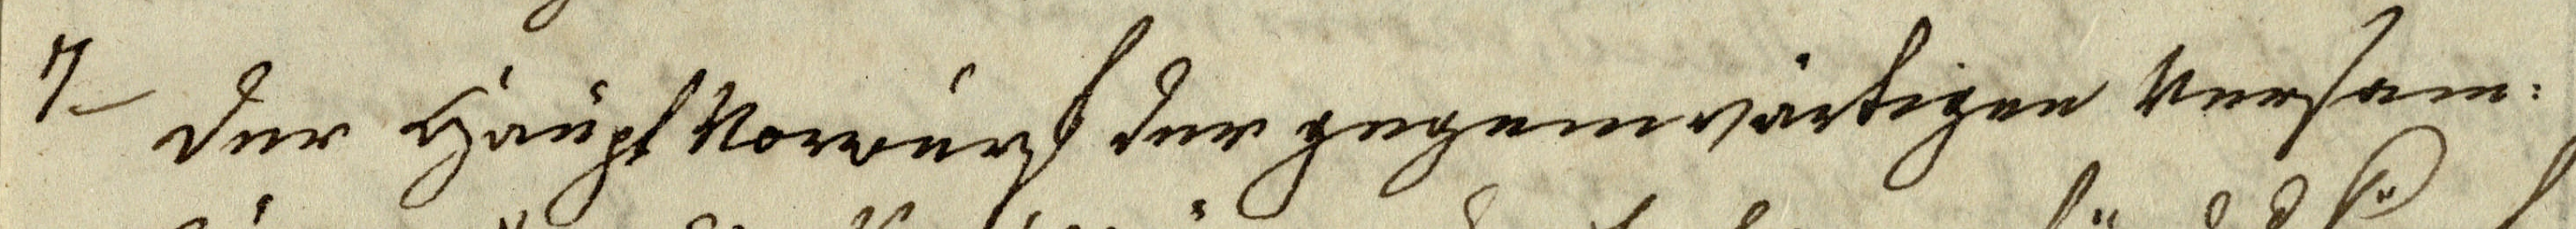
7. Der Haupt Vorwurf der gegenwärtigen Versam¬
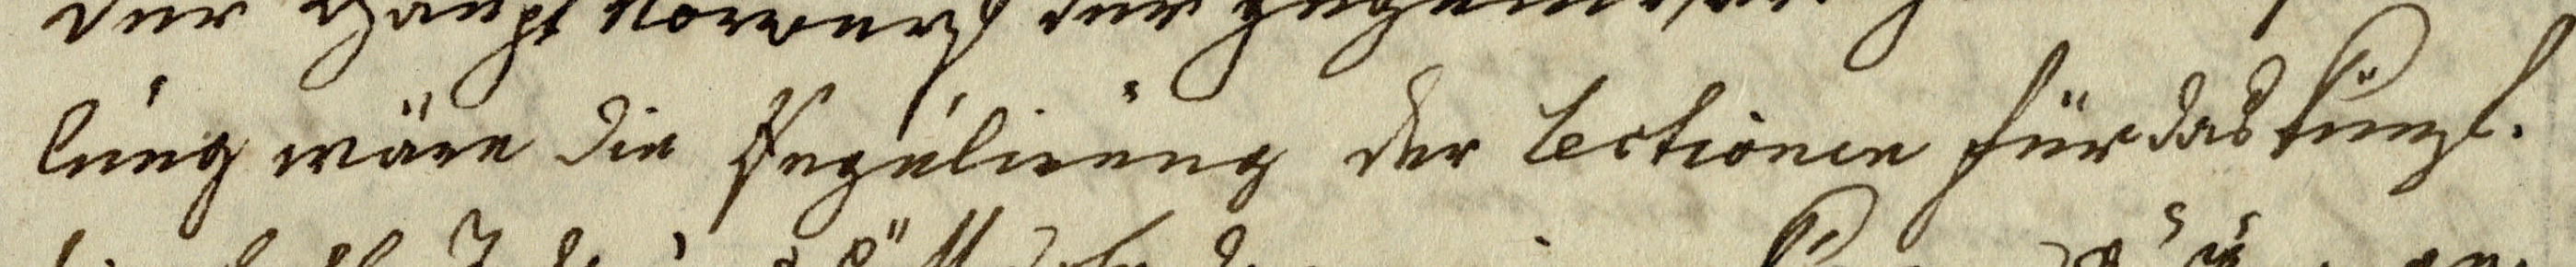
lung wäre die Regulirung der Lektionen für das künf¬
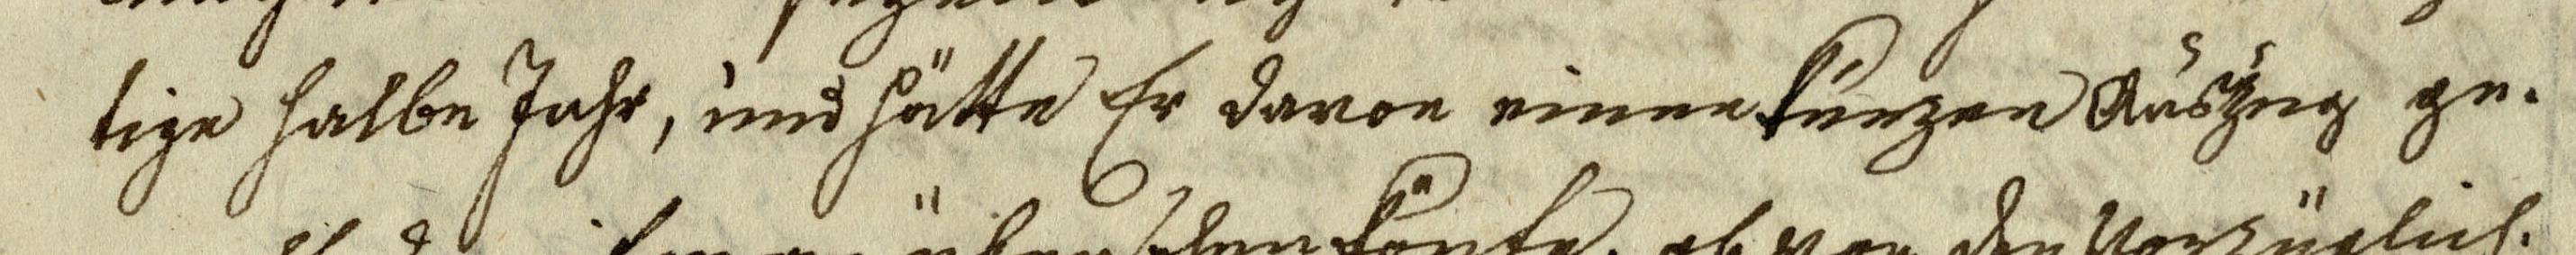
tige halbe Jahr, und hätte Er davon einen kurzen Auszug ge¬
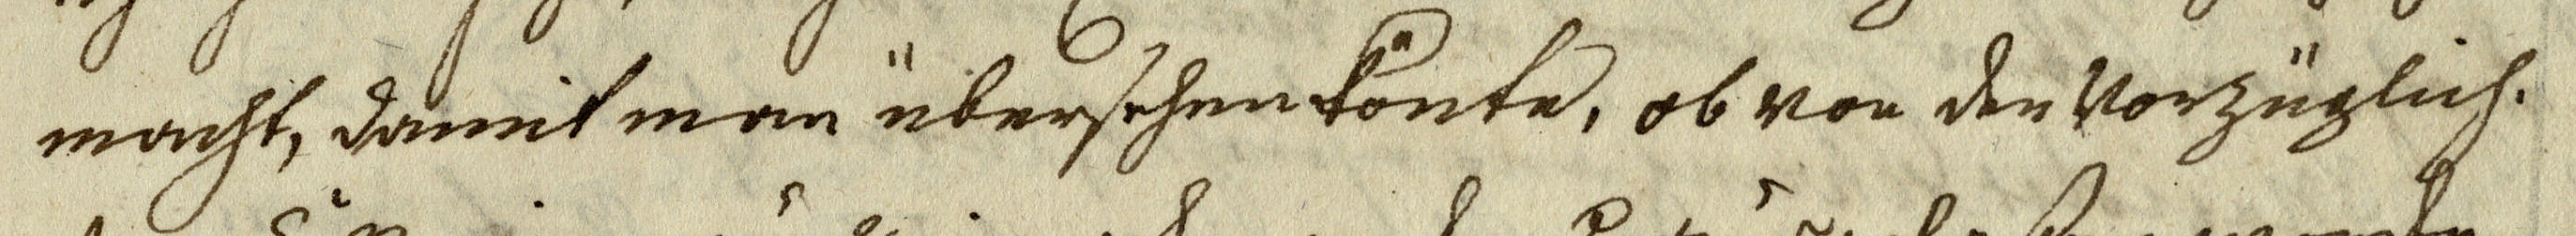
macht, damit man übersehen könte, ob von den vorzüglich¬
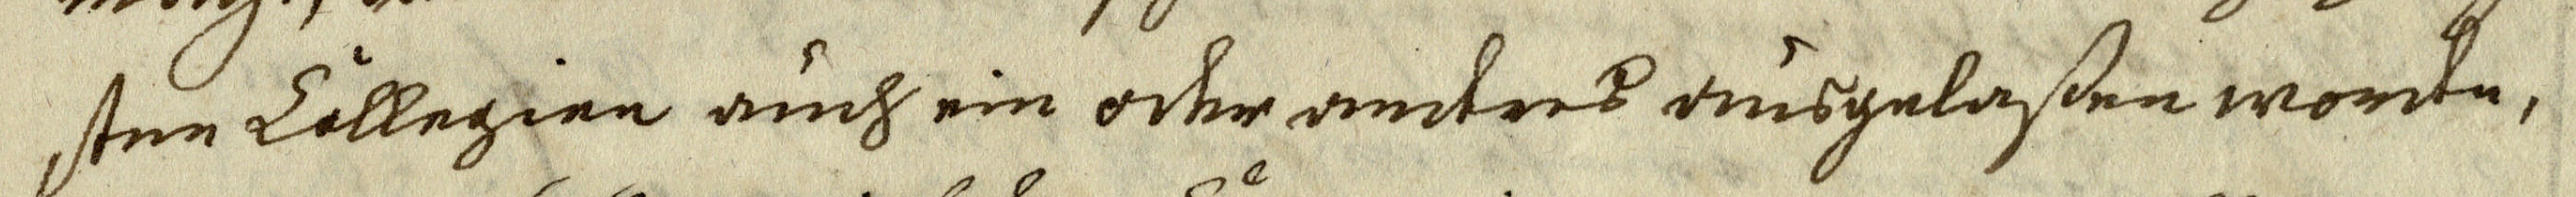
sten Collegien auch ein oder anderes ausgelaßen worden,
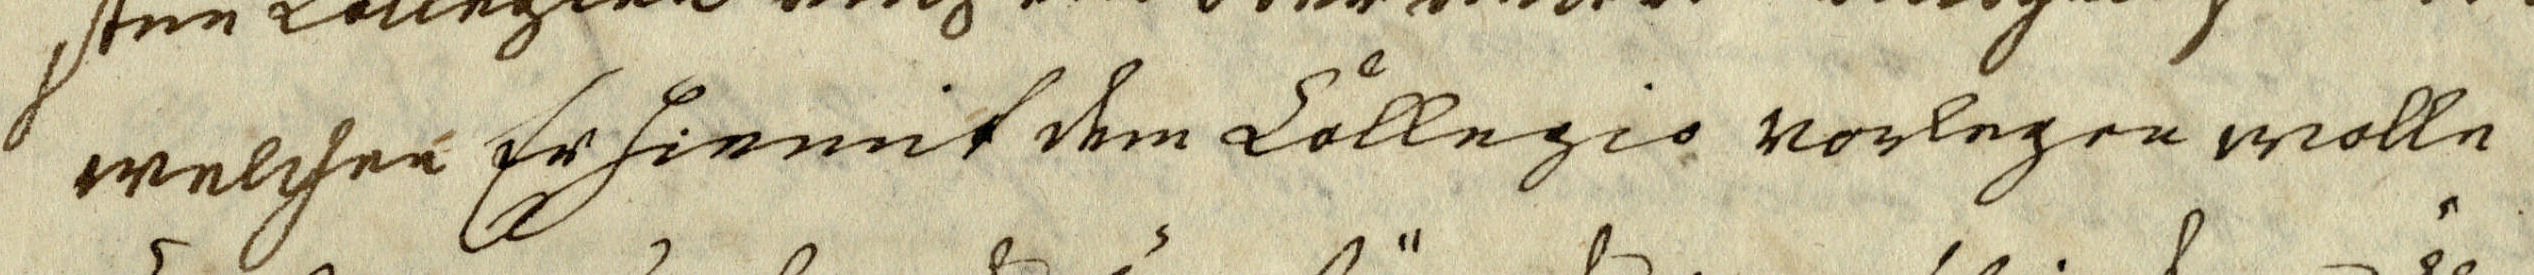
welchen Er hiemit dem Collegio vorlegen wolle.
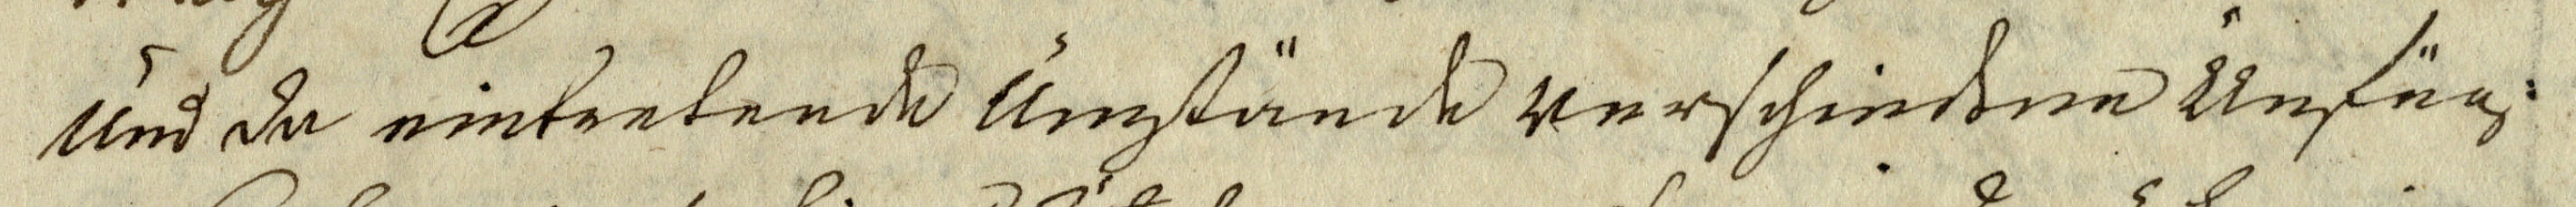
Und da eintretende Umstände verschiedene Unfüg¬
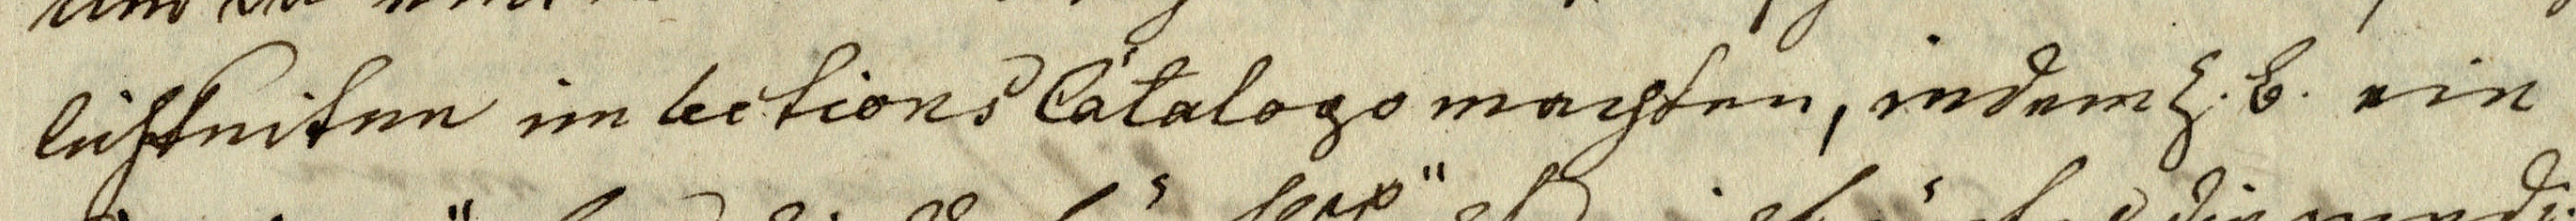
lichkeiten im lections Catalogo machten, indem z. B. ein
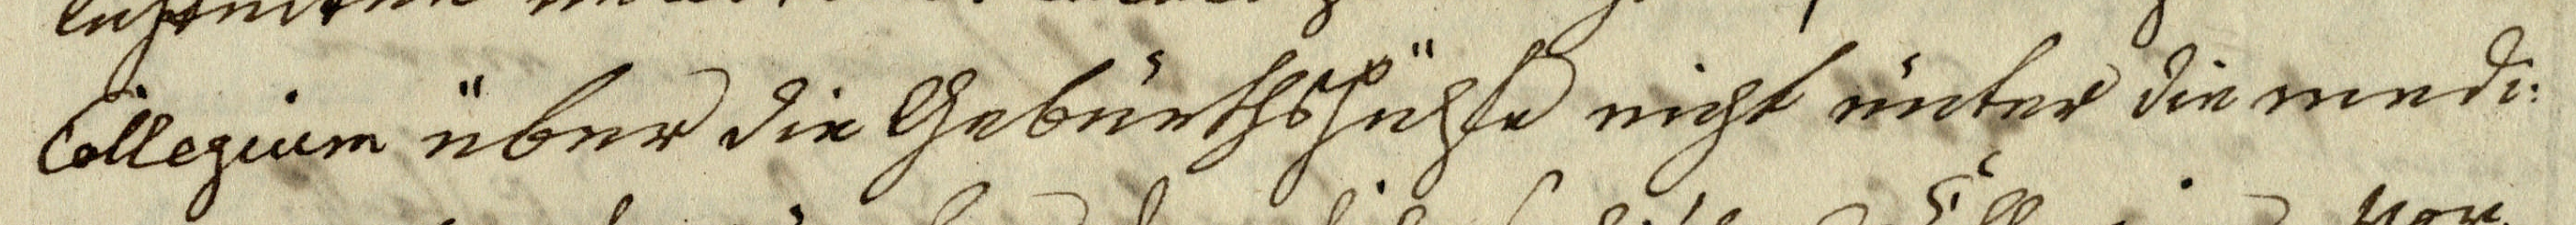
Collegium über die Geburthshülfe nicht unter die medi¬
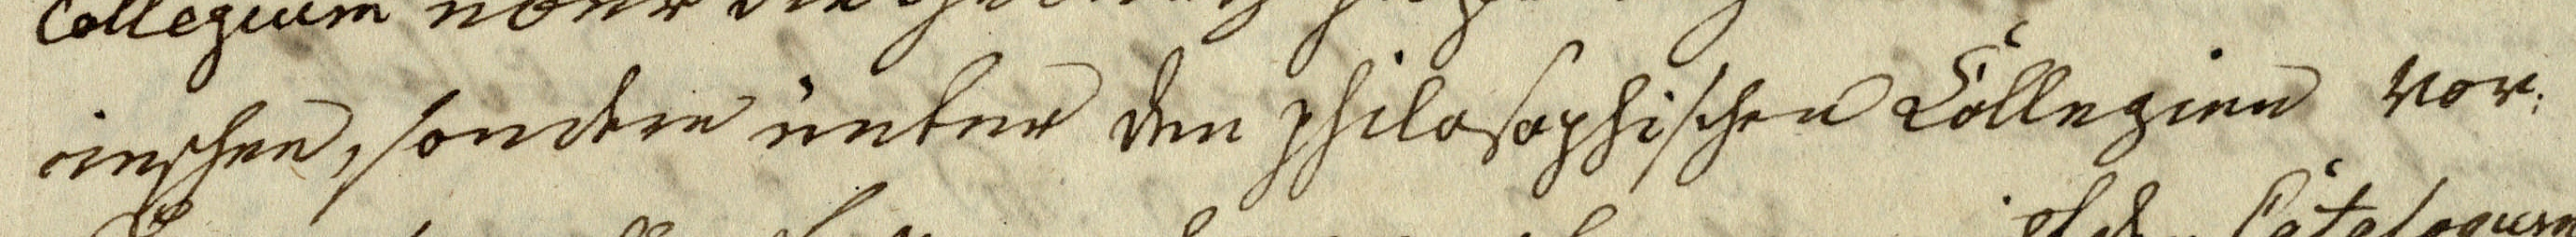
cinischen, sondern unter den philosophischen Collegien vor¬
